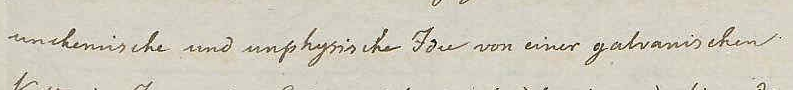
unchemische und unphysische Idee von einer galvanischen
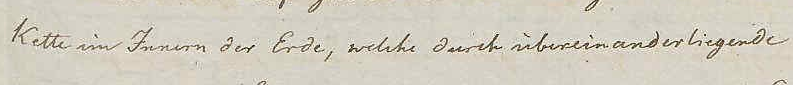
Kette im Innern der Erde, welche durch übereinanderliegende
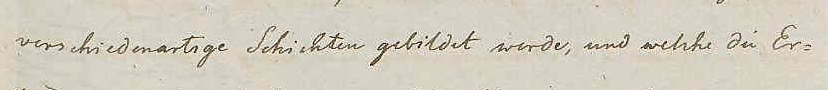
verschiedenartige Schichten gebildet werde, und welche die Er-
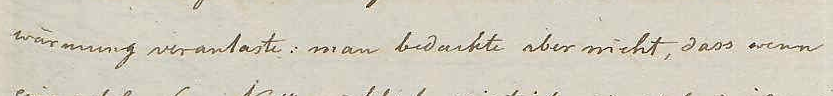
wärmung veranlaste: man bedachte aber nicht, dass wenn
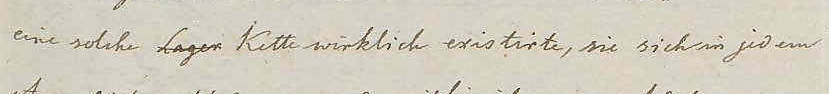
eine solche Lager Kette wirklich existirte, sie sich in jedem
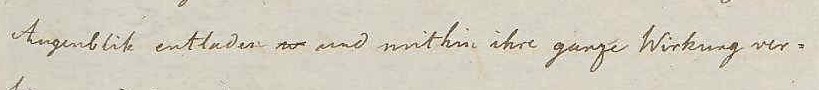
Augenblick entladen w und mithin ihre ganze Wirkung ver-
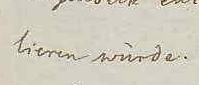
lieren würde.
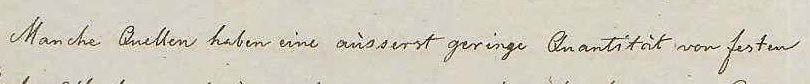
Manche Quellen haben eine äusserst geringe Quantität von festen
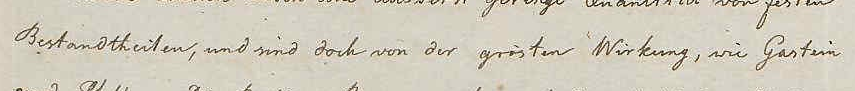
Bestandtheilen, und sind doch von der grösten Wirkung, wie Gastein
